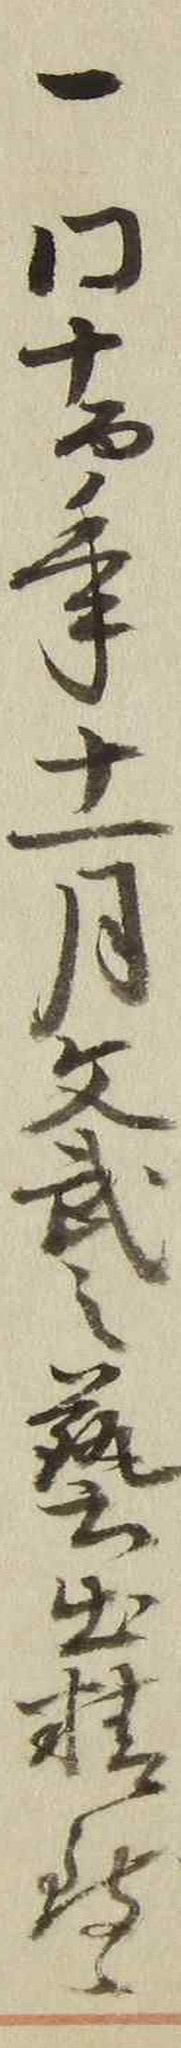一同十酉年十一月文武之芸出精致候
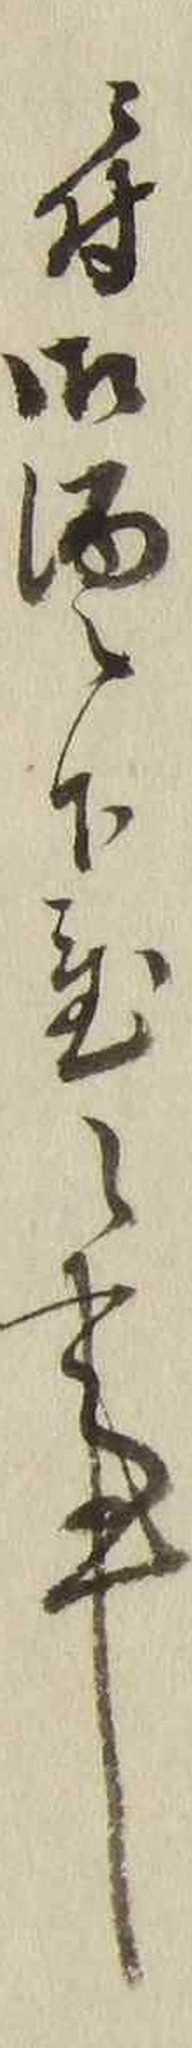ニ付御酒被下置候事
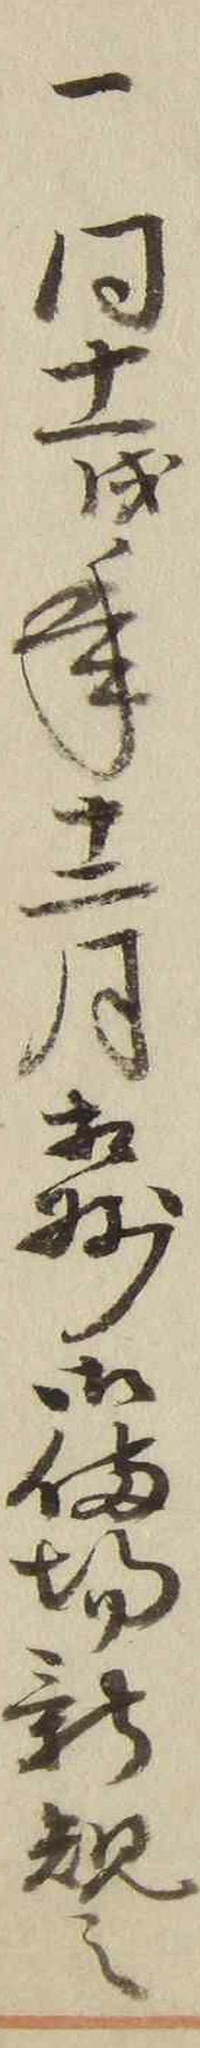一同十一戌年十二月相州備場新規之

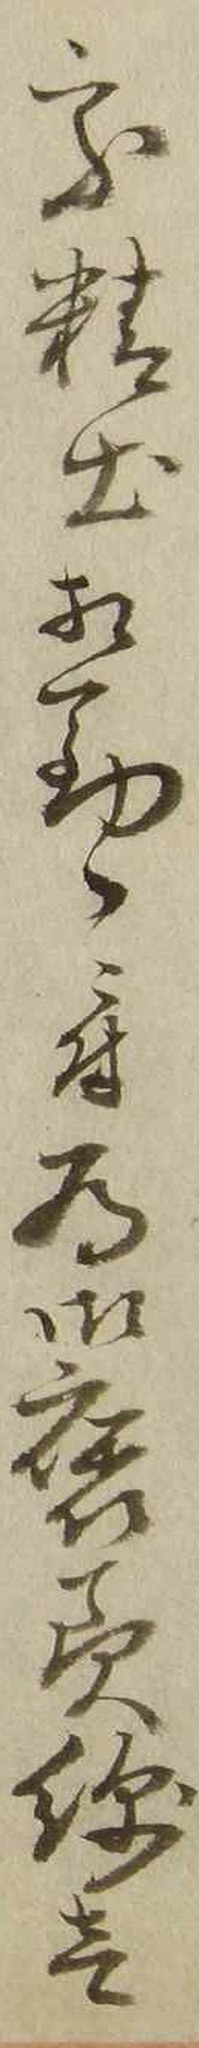処精出相勤候ニ付為御褒美綿壱
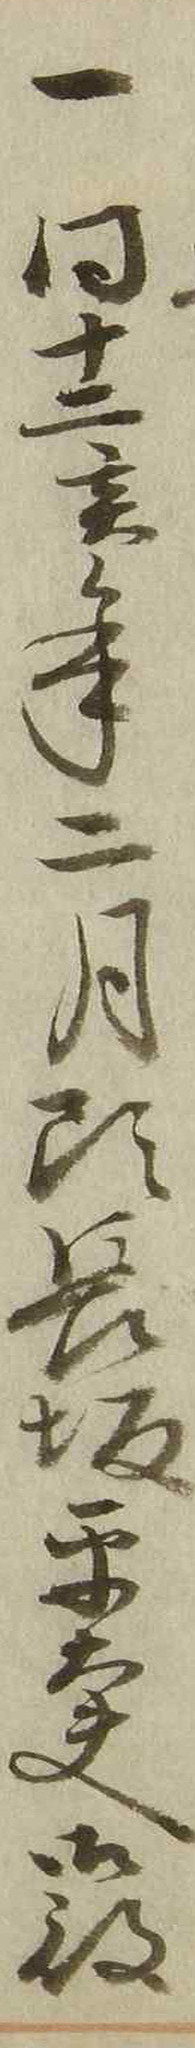一同十二亥年二月頭長坂平大夫御役
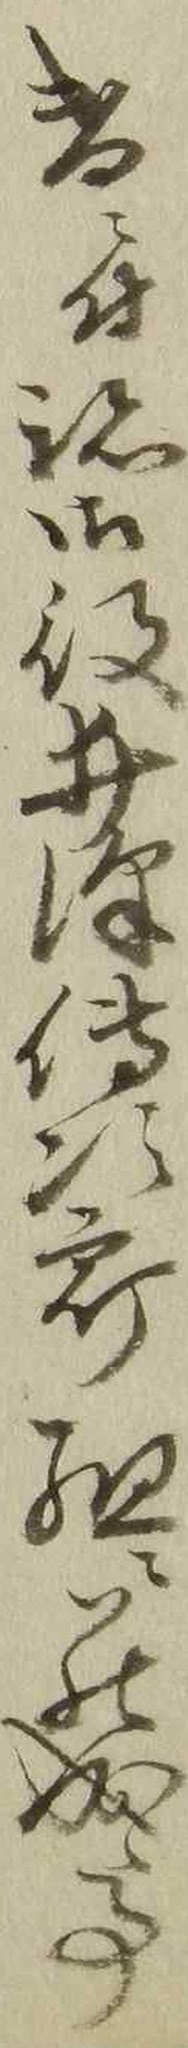替ニ付跡御役井深伝次郎組ニ罷成候事
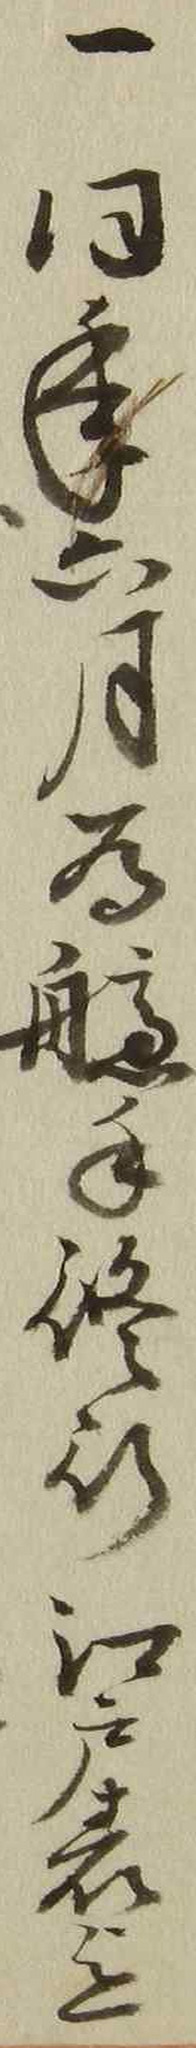一同年六月為艫手修行江戸表迄
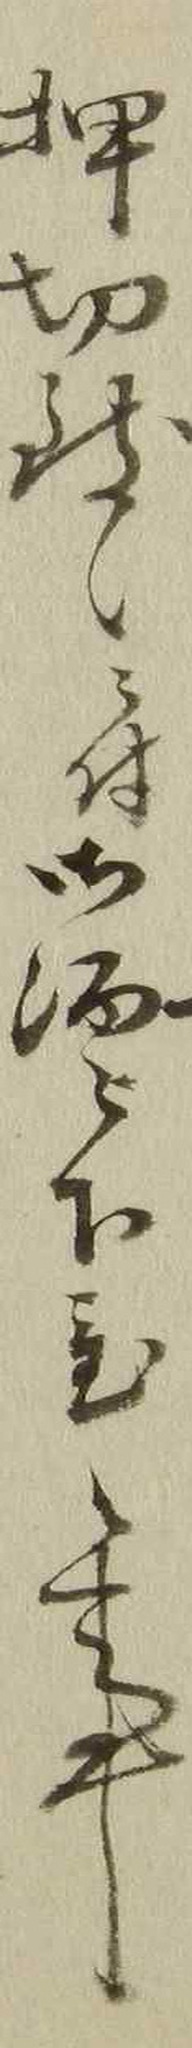押切致候ニ付御酒被下置候事
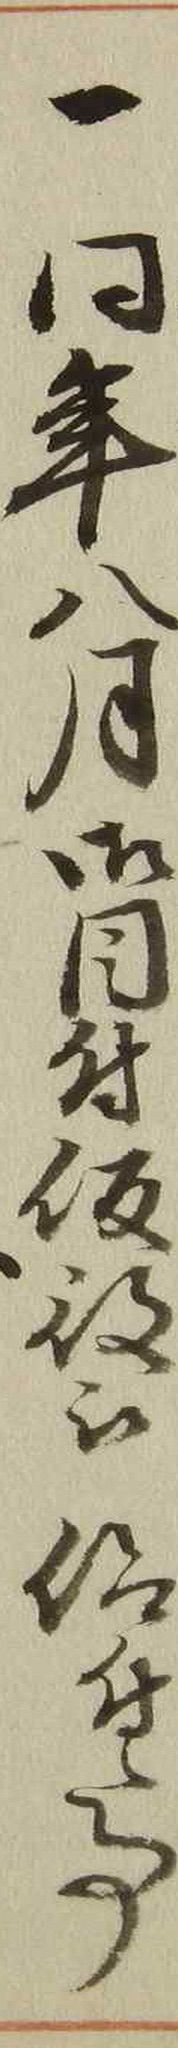一同年八月御目付仮役被仰付候事
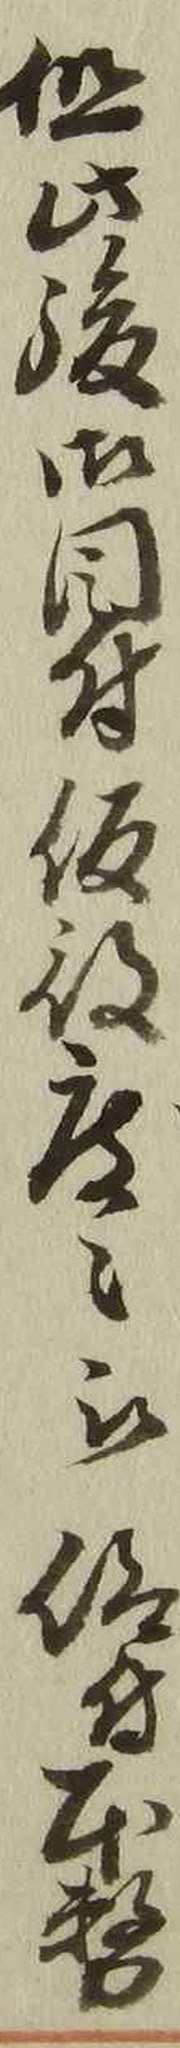但此後御目付仮役度々被仰付本務
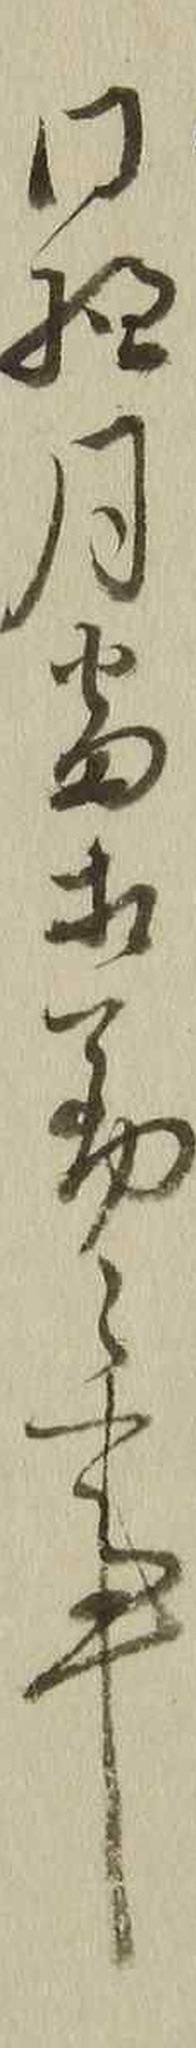同様月番相勤之事
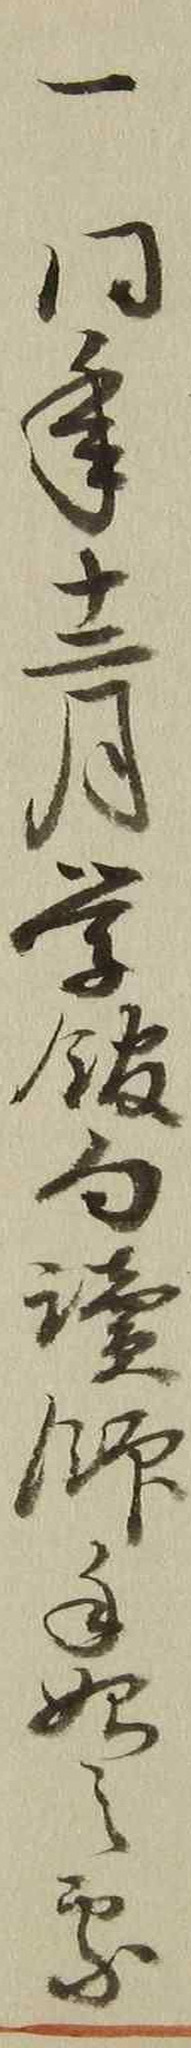一同年十二月学館句読師手始之処
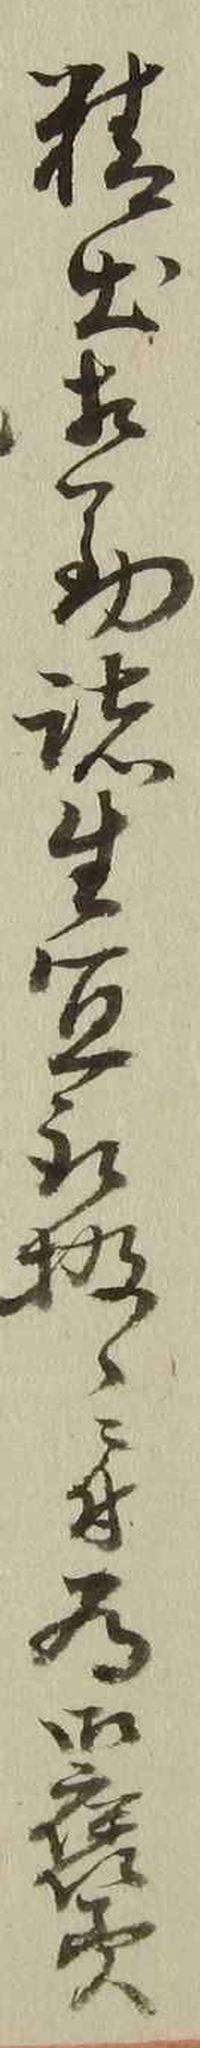精出相勤諸生宜取扱候ニ付為御褒美
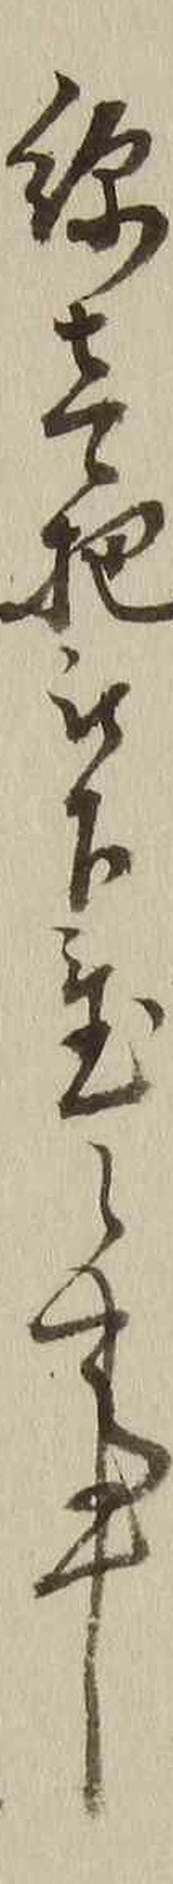綿壱把被下置候事
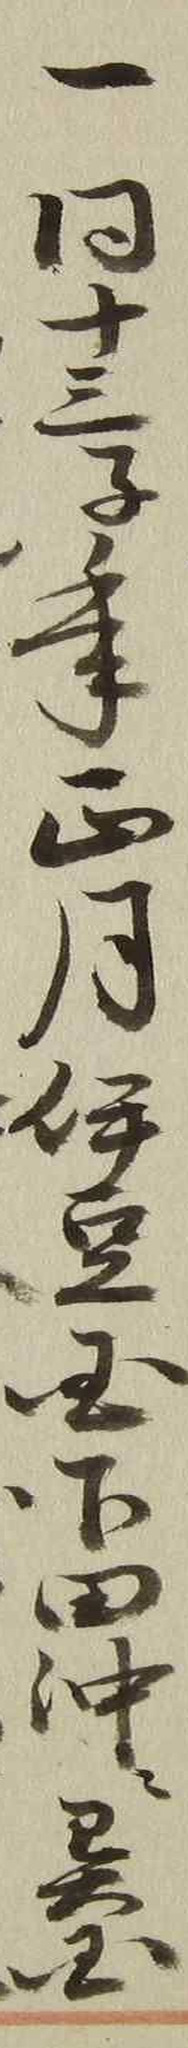一同十三子年正月伊豆国下田沖ニ異国
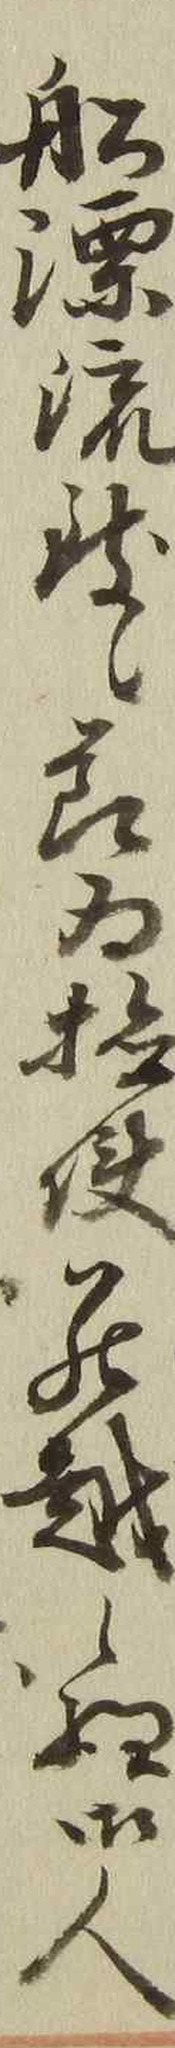船漂流致候節為検使罷越候様御人
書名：諸士系譜　巻之53　に之部4
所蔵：会津若松市立会津図書館
